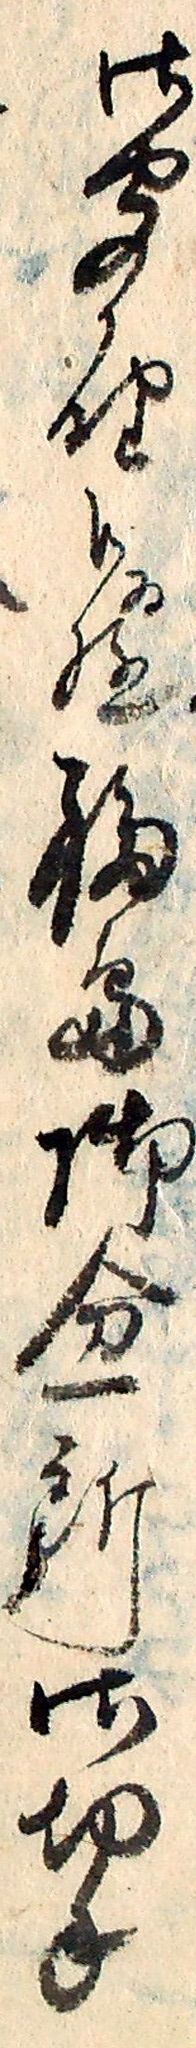御聞届被為遊福島御分一所御切手
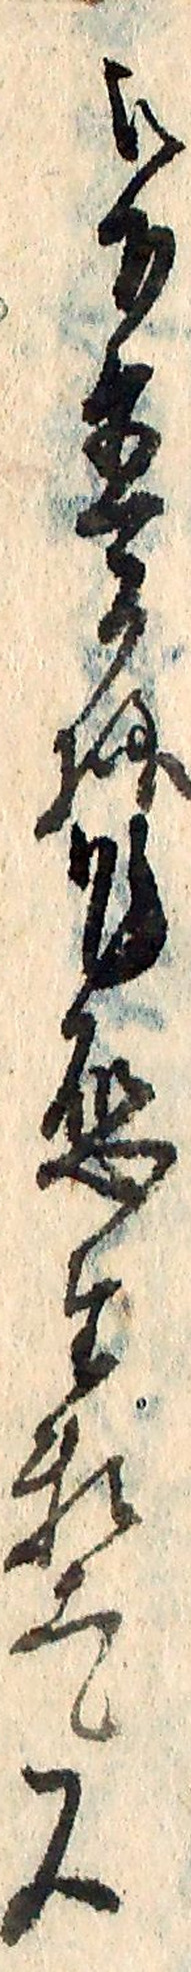被下置候様乍恐奉願上候以上
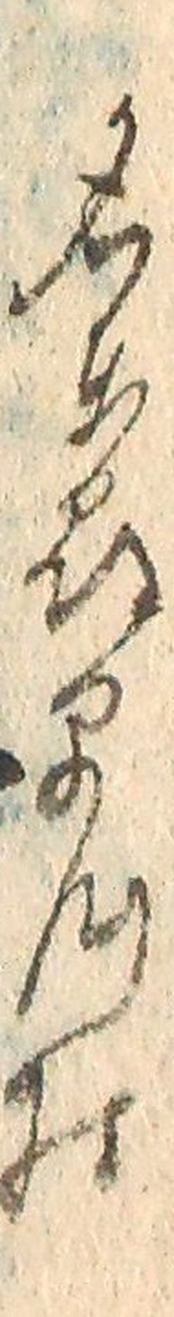名東郡早淵村
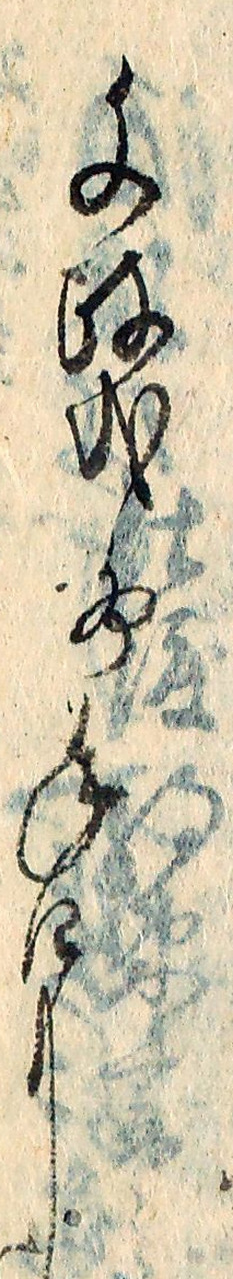文政弐卯年四月
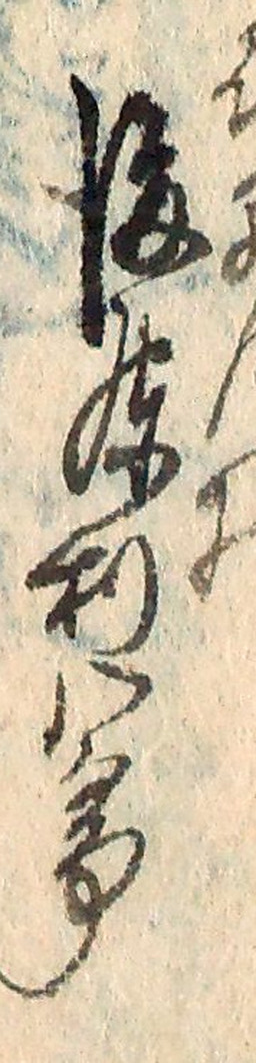後藤利八郎
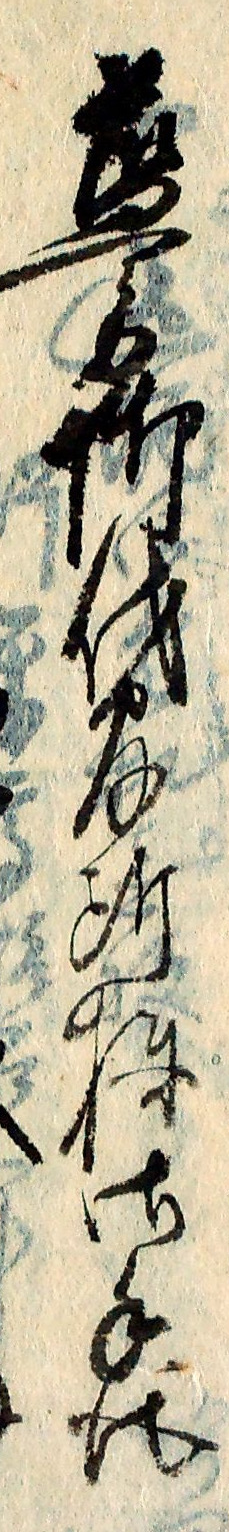藍方御代官所様御手代
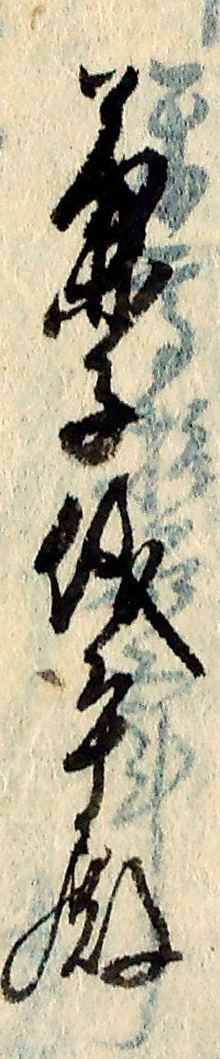兼子儀平殿
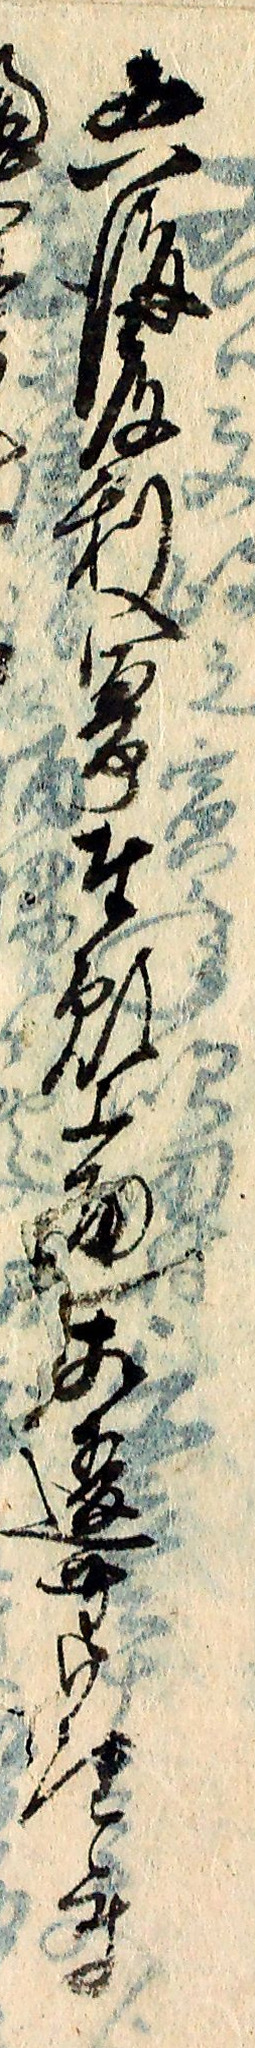右後藤利八郎奉願上通相違無御座候付
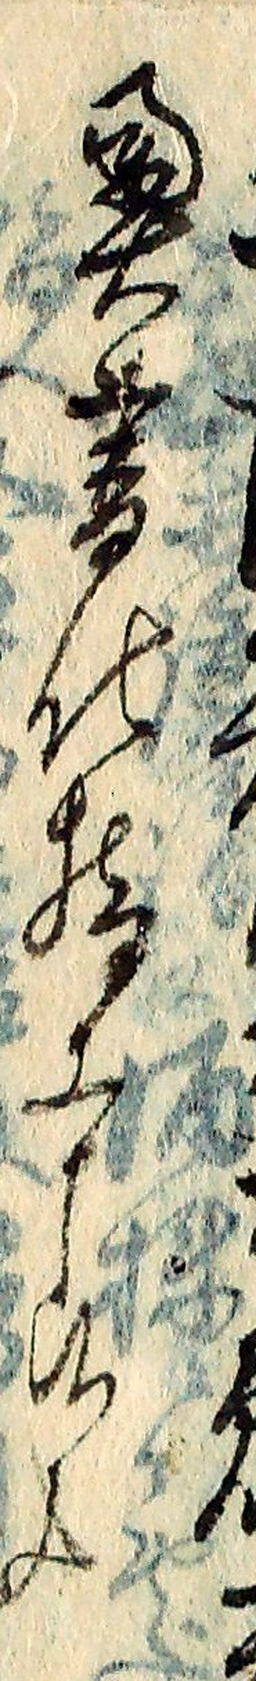奥書仕指上申候以上
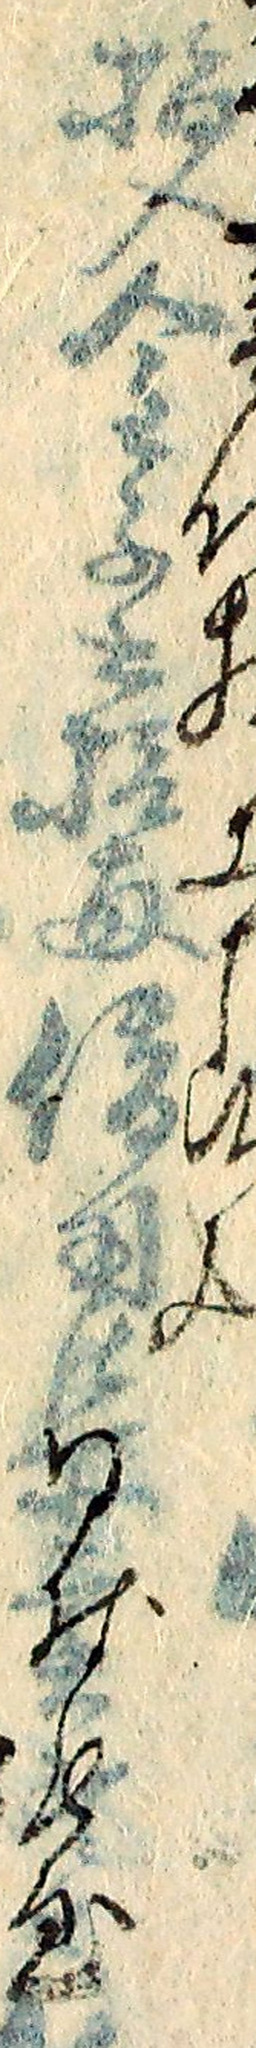同村庄屋
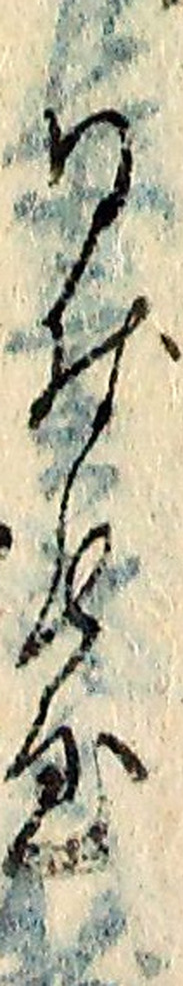同村庄屋
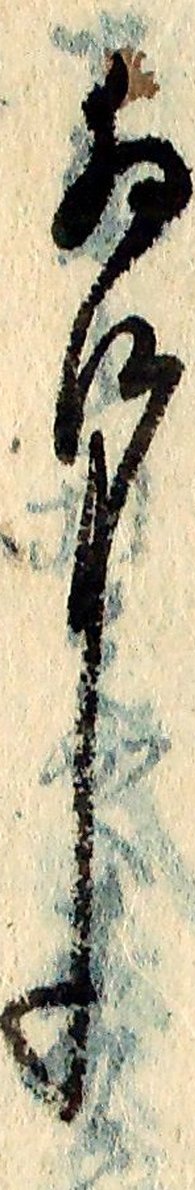卯四月
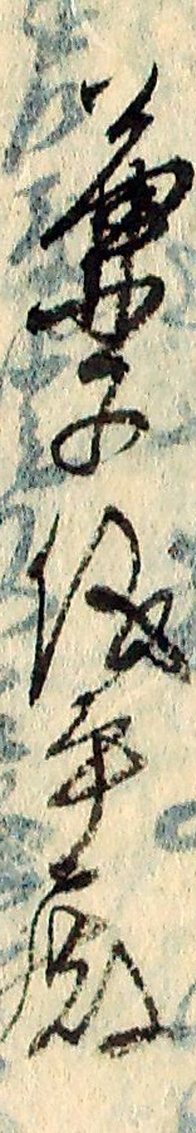兼子儀平殿

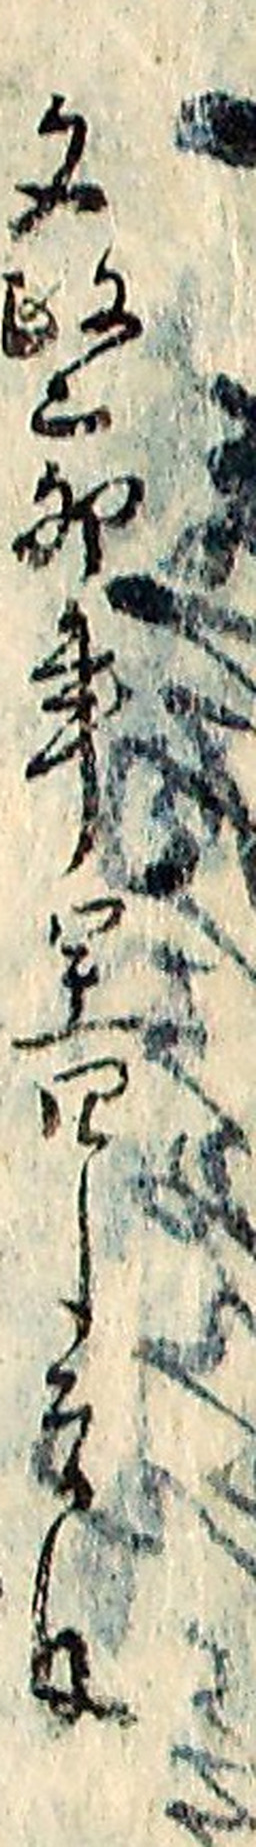文政二卯年閏四月二日
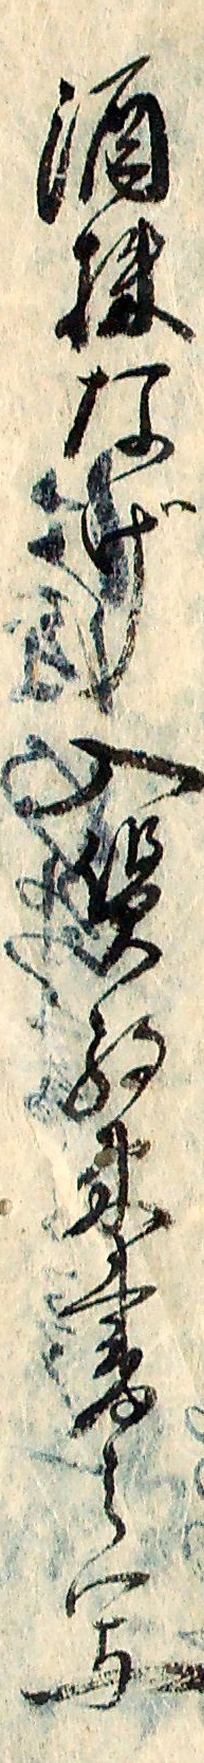酒株なげ入質約束書之写

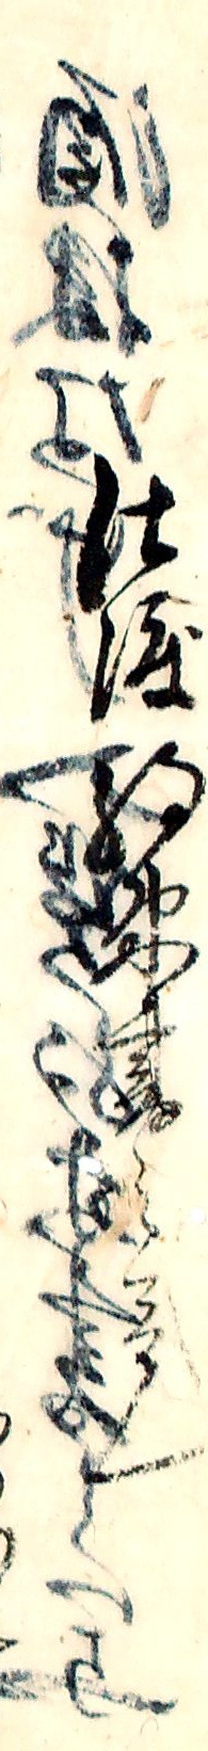御渡約束書之覚
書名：諸御願書控(後藤氏壱番）
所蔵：鳴門教育大学 Naruto University of Education
